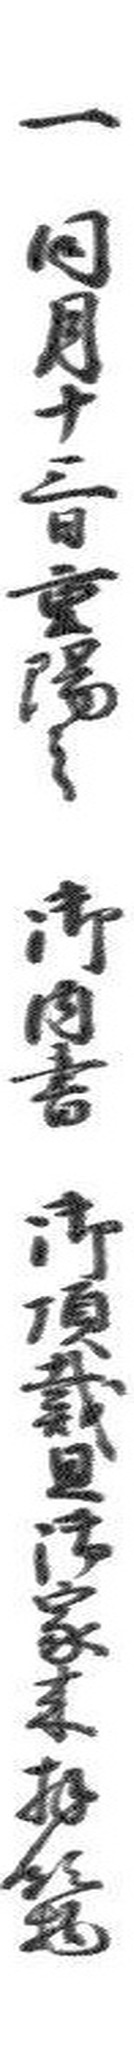一同月十三日重陽之御内書御頂戴且御家来拝領物
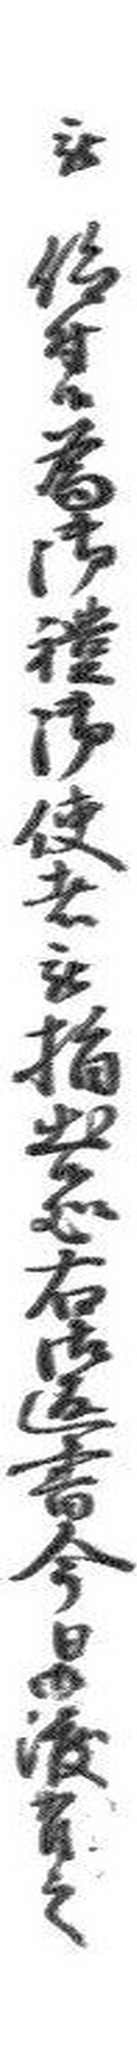被仰付候為御礼御使者被指出候処右御返書今日御渡有之
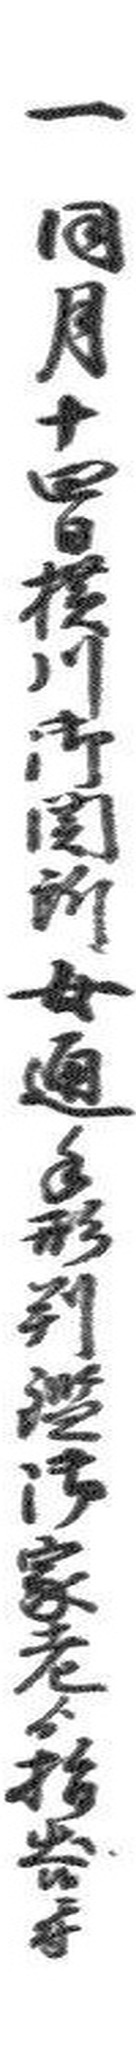一同月十四日横川御関所女通手形半鑑御家老ゟ指出候ニ付
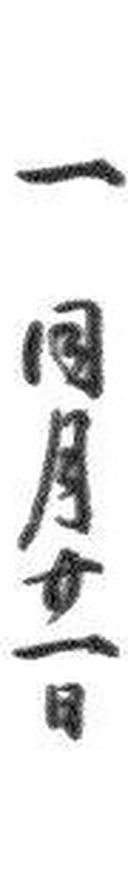一同月廿一日
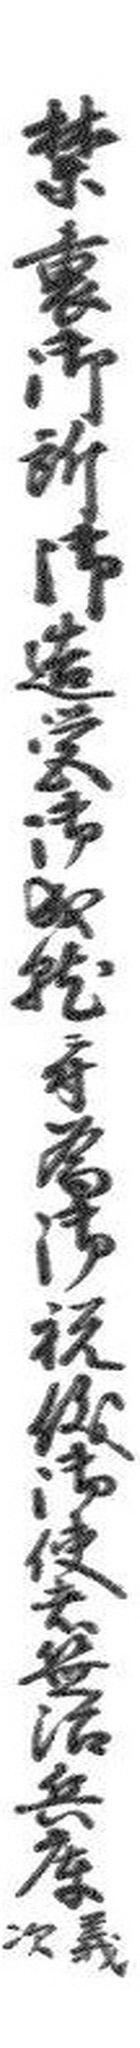禁裏御所御造営御成就ニ付為御祝儀御使者笹治兵庫義次

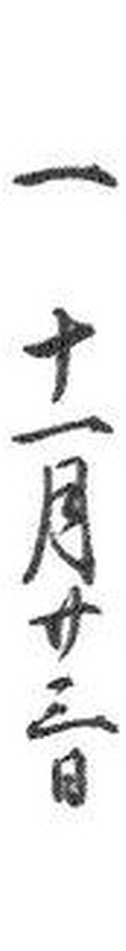一十一月廿三日
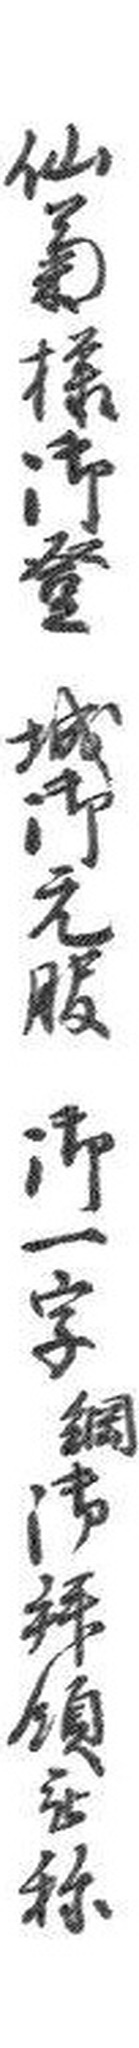仙菊様御登城御元服御一字綱御拝領被称
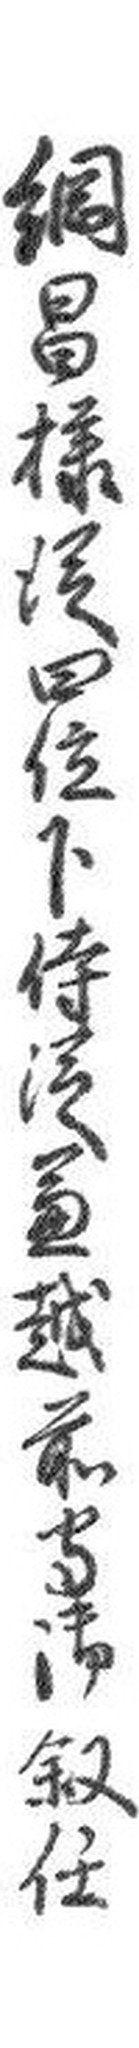綱昌様従四位下侍従兼越前守御叙任
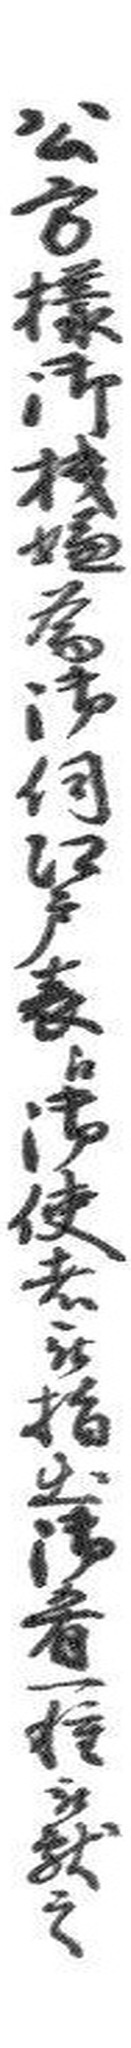公方様御機嫌為御伺江戸表江御使者被指出御肴一種被献之
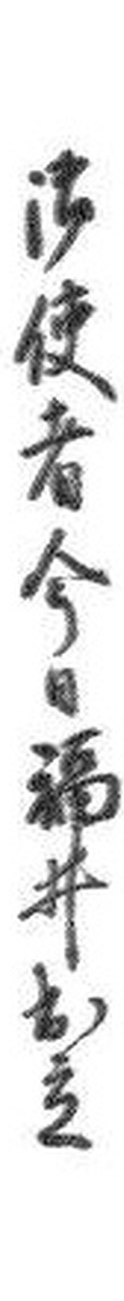御使者今日福井出立
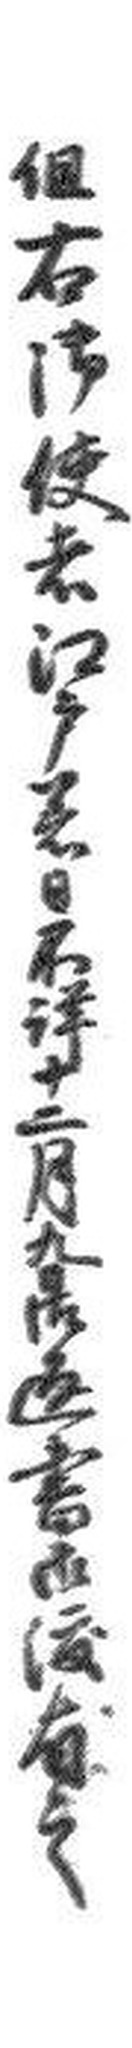但右御使者江戸着日不詳十二月九日御返書御渡有之
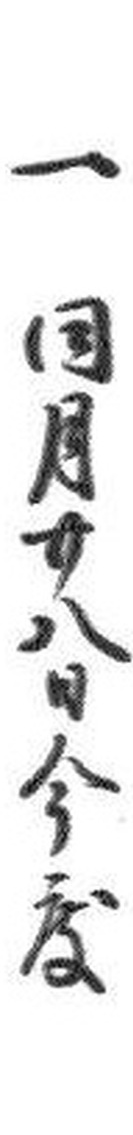一同月廿八日今度
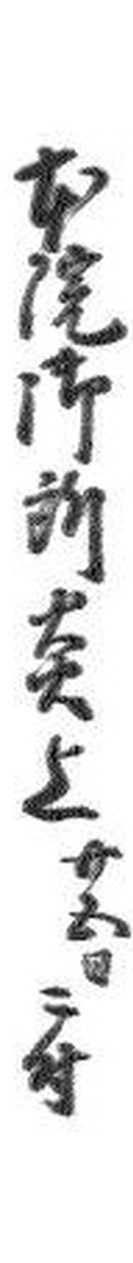本院御所炎上廿五日ニ付
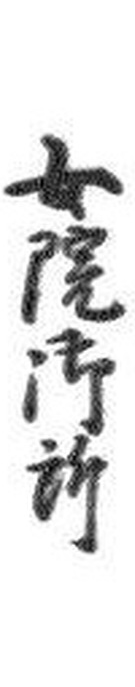女院御所
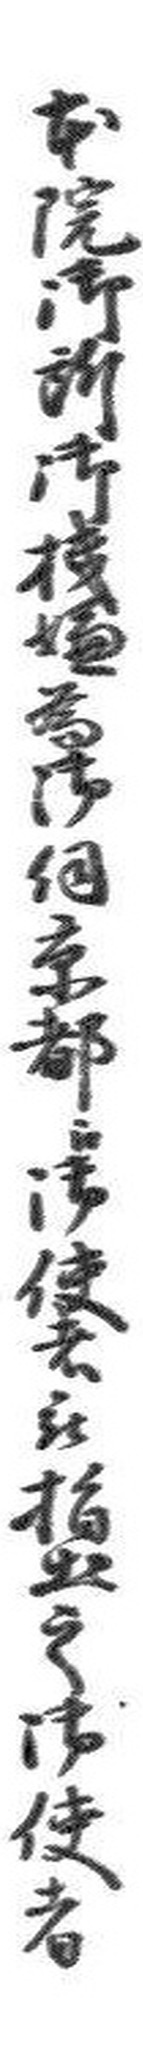本院御所御機嫌為御伺京都江御使者被指出之御使者
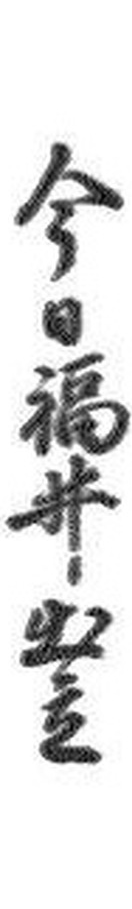今日福井出立
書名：家譜 十一 昌親公 従延宝二年到延宝四年八月
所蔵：福井県文書館 Fukui Prefectural Archives
